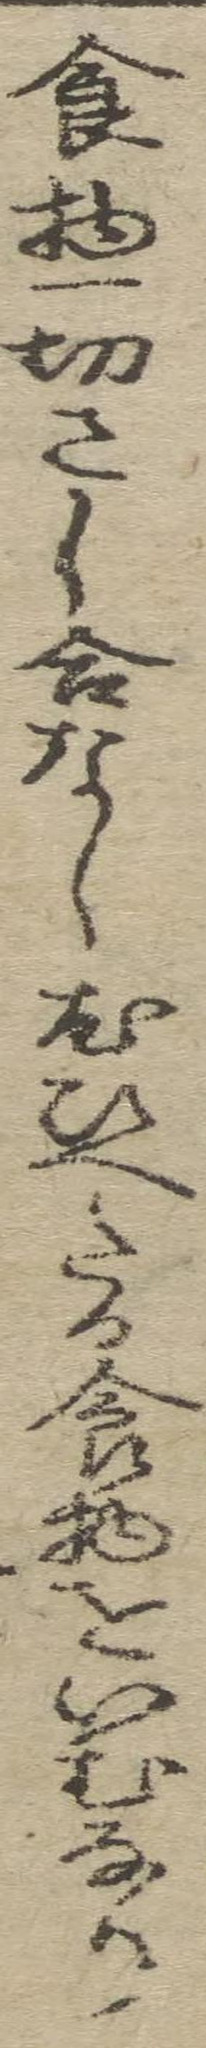食物一切さし合なし尤ひへたる食物をいむなり
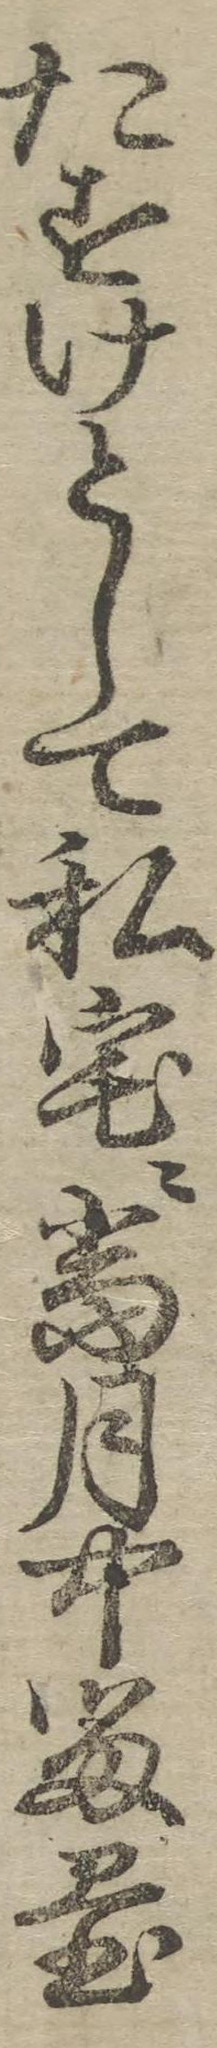たすけとして私宅に当月中留置
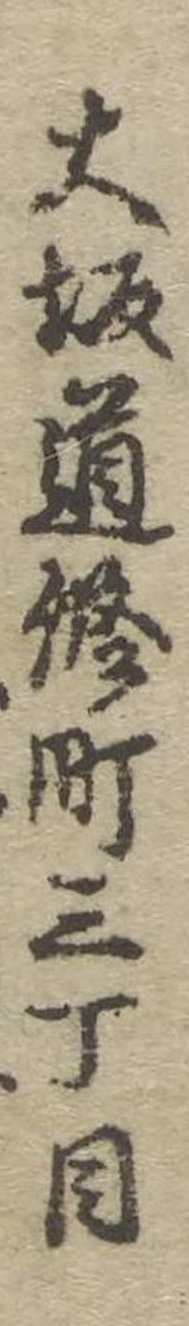大坂道修町三丁目
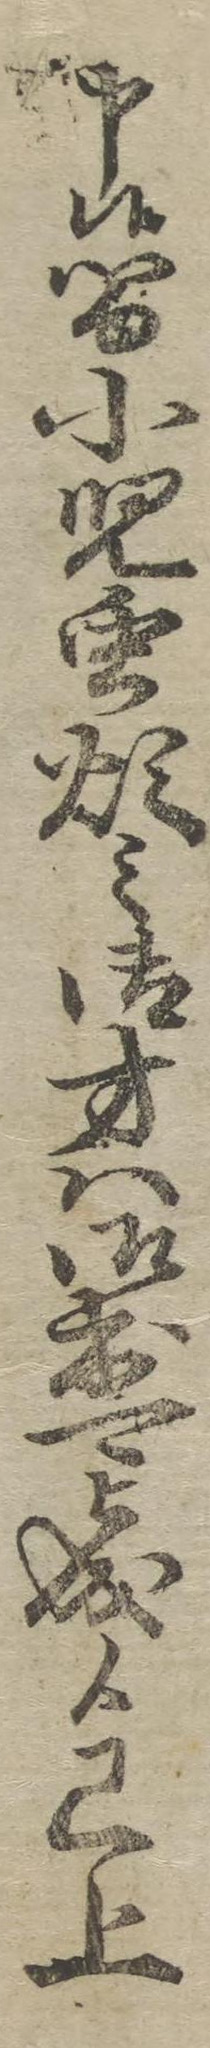申候間小児虫煩之御方は御出可被成候已上
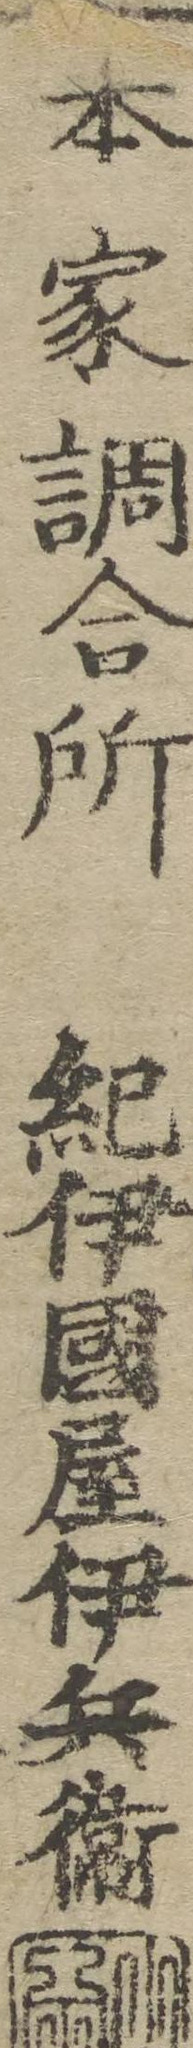本家調合所紀伊国屋伊兵衛刻印山？
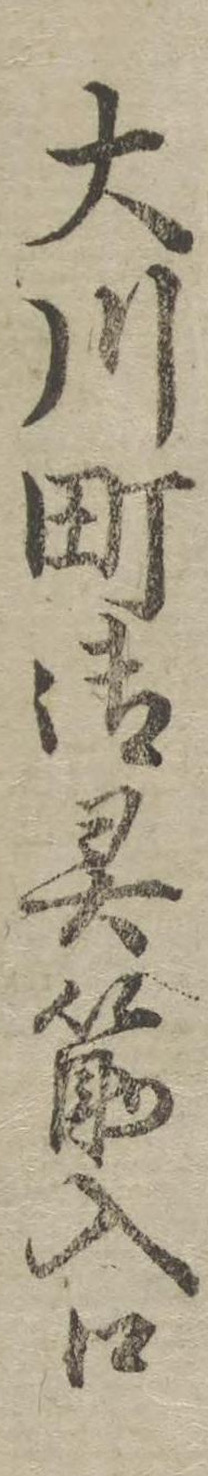大川町御霊筋入口
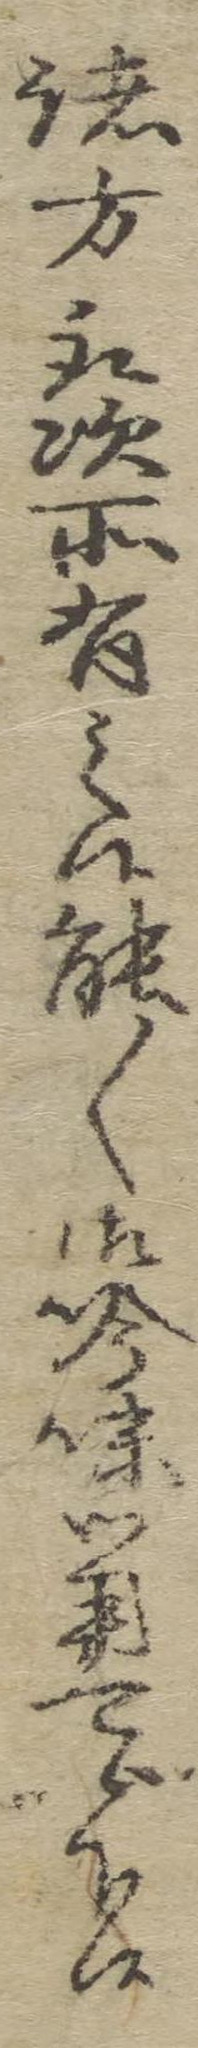諸方取次所有之候能々御吟味御用可被下候
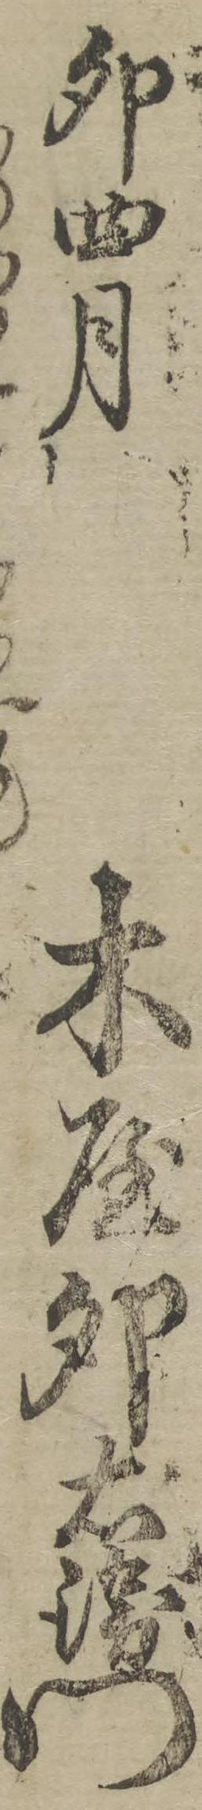卯四月木屋卯右衛門

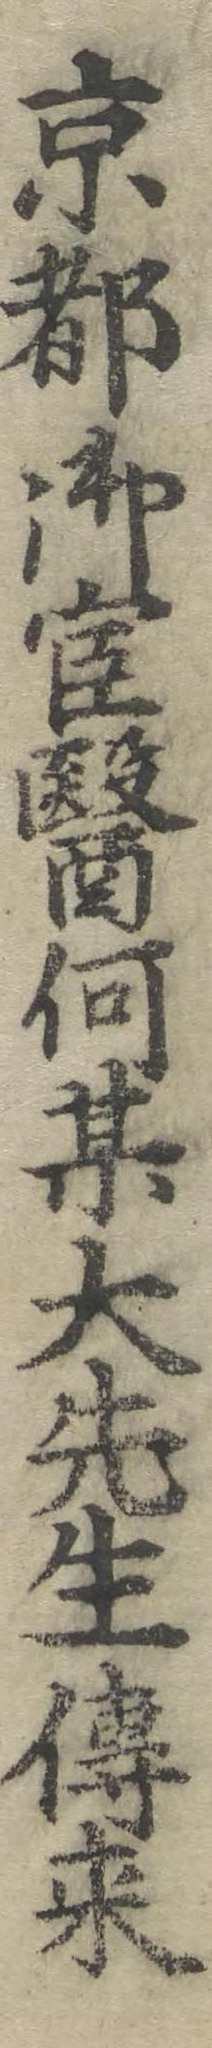京都御宦医何某大先生伝来
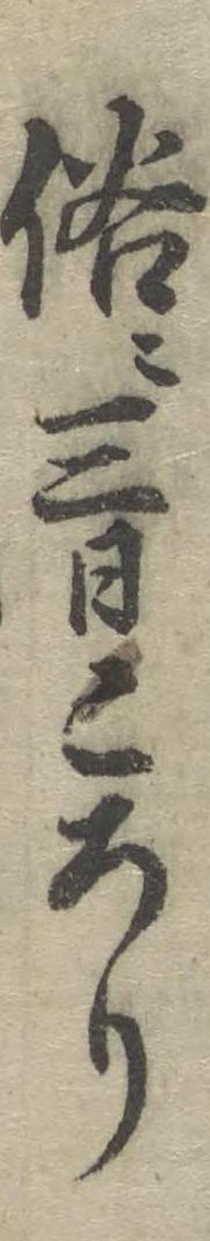俗に三日ころり
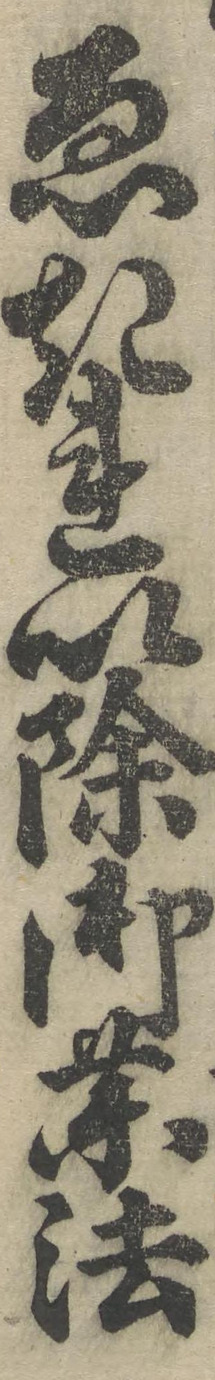ゑきれい除御薬法
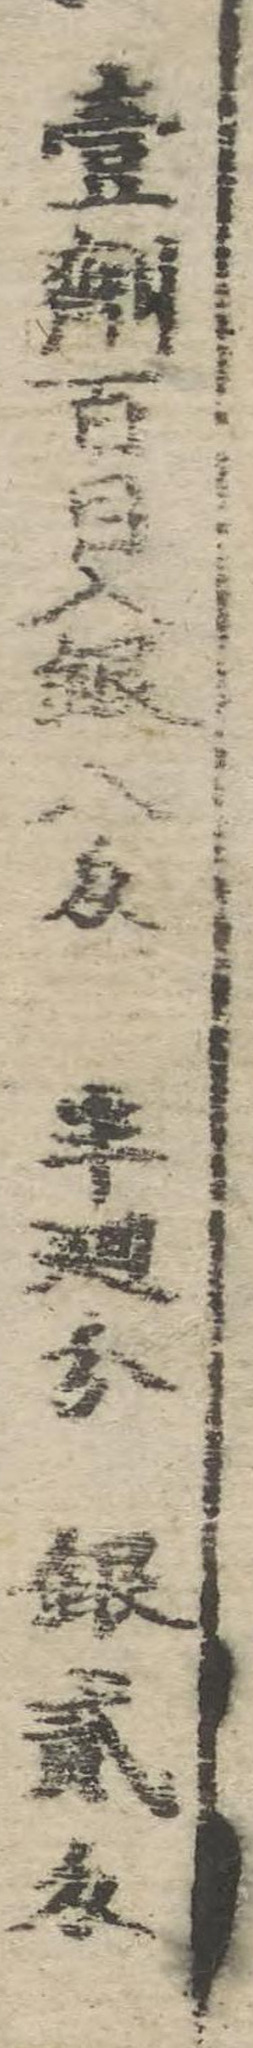價壱劑百目入銀八匁半廻分銀弐匁
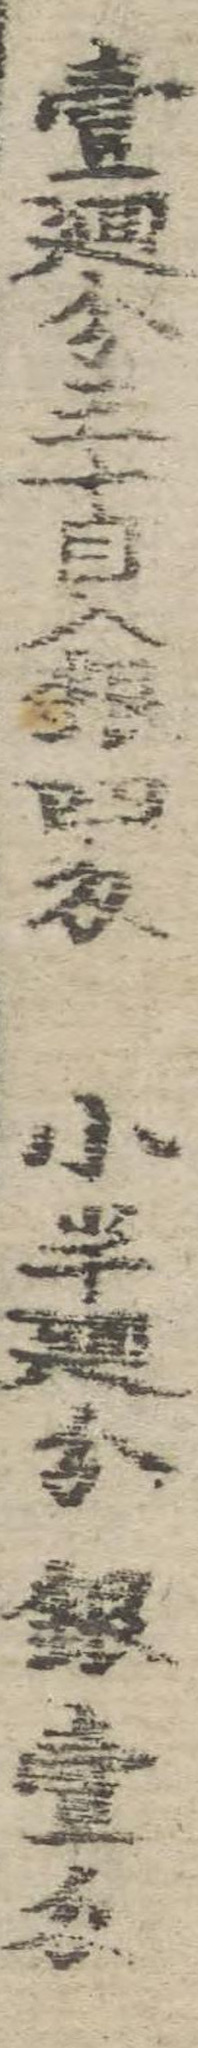壱廻分三十目入銀四匁小半廻分銀壱分
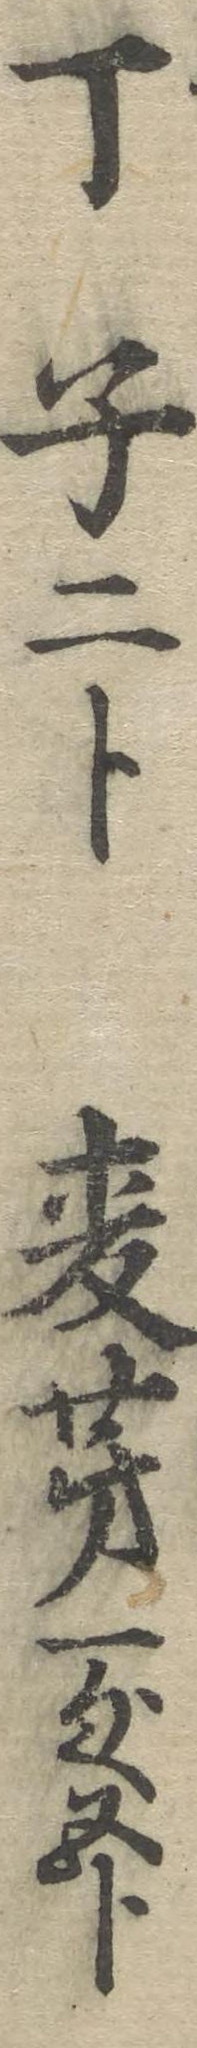丁子二分麦芽一匁五分
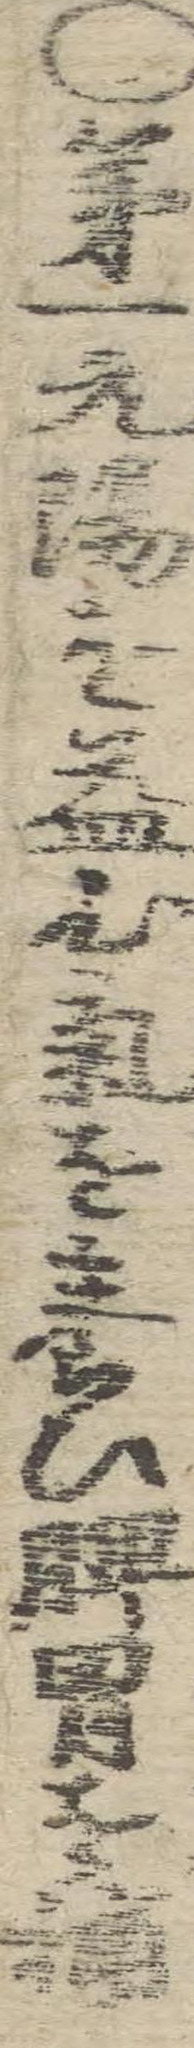〇第一元陽を益心気を養ひ脾胃を補ふ
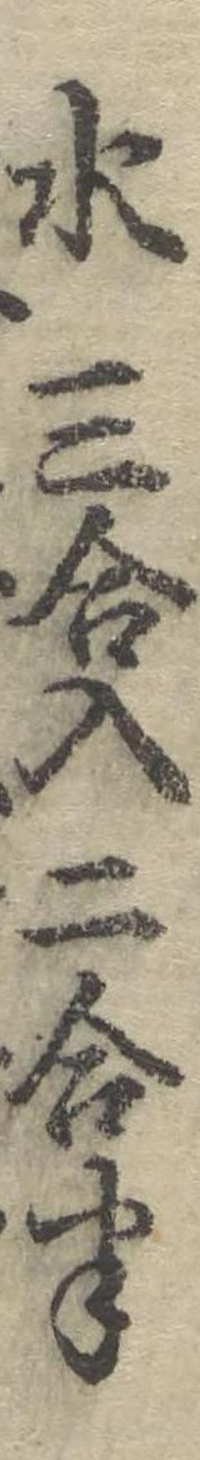二番三合入一合半
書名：浪華薬種問屋能書張交帖. 二
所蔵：国立国会図書館 National Diet Library, JAPAN
